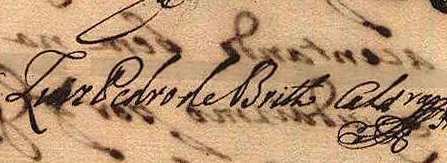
Luiz Pedro de Britto Calora
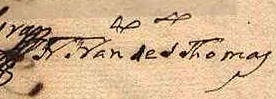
Fr Franco de Sto Thomas
